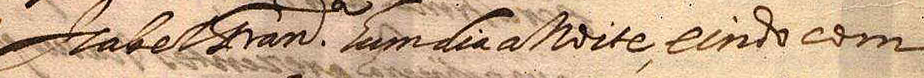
Jzabel Fran.ca hum dia a noite, e indo com
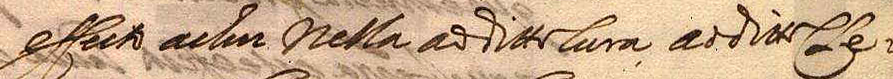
effeito achou nella ao ditto Cura, ao ditto Cle
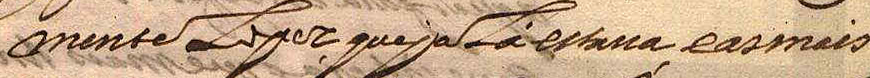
mente Lopez, que ja Lá estaua, e as mais
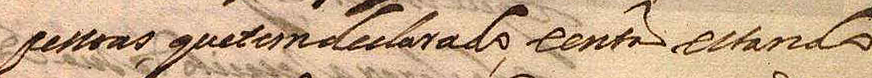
pessoas, que tem declarado, e entaõ estando
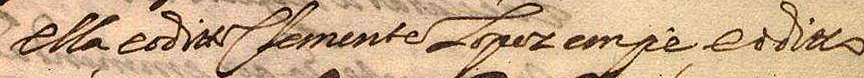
ella, e o ditto Clemente Lopez em pé, e o ditto
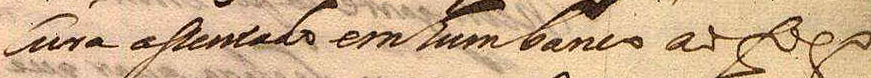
Cura assentado em hum banco ao fogo
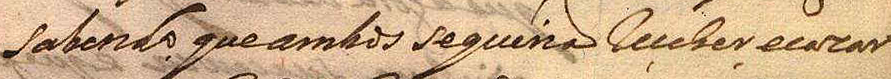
sabendo, que ambos se queriaõ Reçeber, e cazar
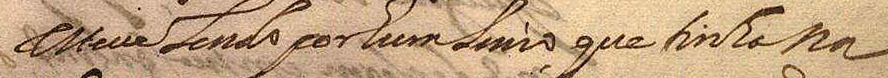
esteue Lendo por hum Liuro, que tinha na
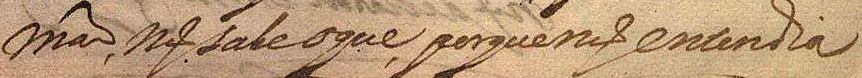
maõ, naõ sabe o que, porque naõ entendia
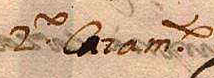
2.o Cazam.to
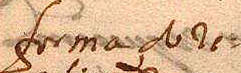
forma do Re
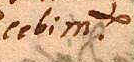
cebim.to
